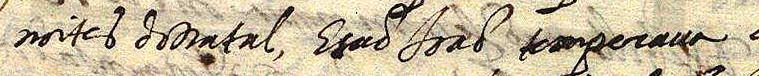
noites do natal, E saõ Joaõ, temperaua a
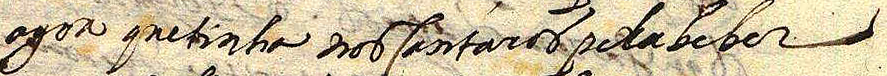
agoa que tinha nos Cantaros pela beber
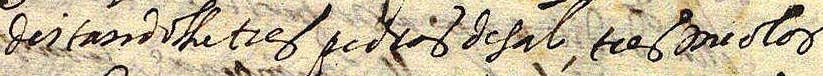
deitandolhe tres pedras de sal, tres meolos
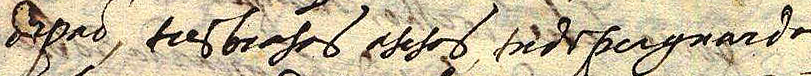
de paõ, tres brasas asesas, tudo per guarda
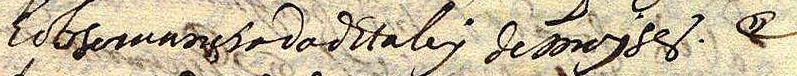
E obseruancia da dita ley de moyses. E
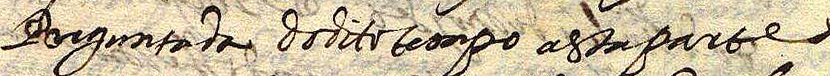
Perguntada do dito tempo a esta parte
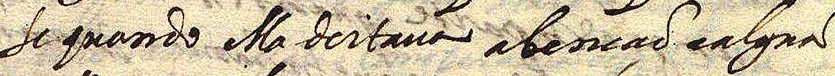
se quando ella deitaua a bençaõ a alguā
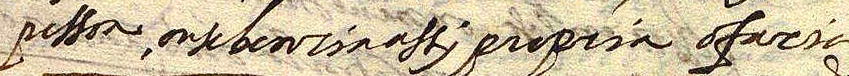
pessoa, ou se benzia a ssy propria o fazia
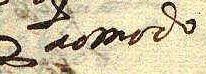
ao modo
